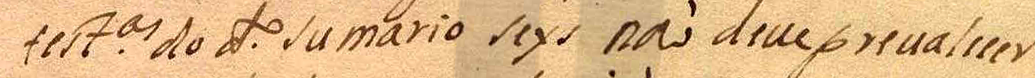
test.as do d̄.o sumario seys naõ deue preualecer
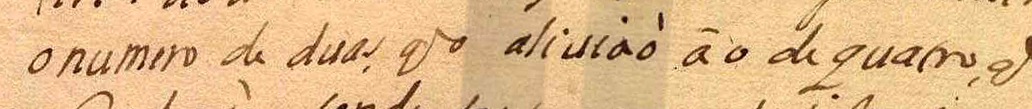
o numero de duas, q̄ o aliuiaõ ào de quatro, q̄
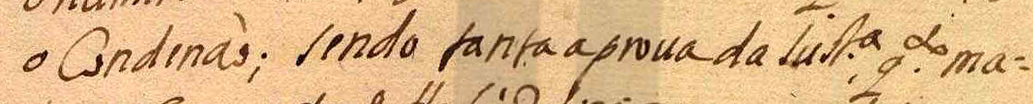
o Condenaõ; sendo tanta a proua da Iust.a, q.to ma
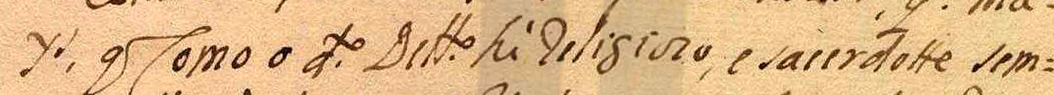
ys, q̄ Como o d̄.o Delt.o hé Religiozo, e sacerdotte sem
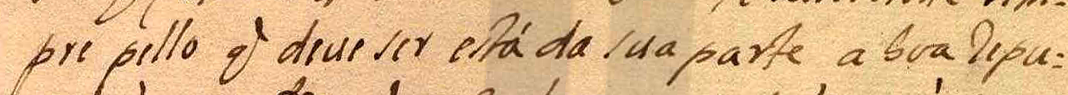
pre pello q̄ deue ser está da sua parte a boa Repu
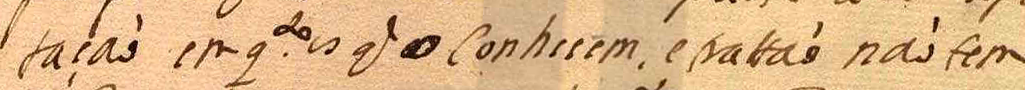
taçaõ emq.to os q̄ o conhecem, e trattaõ naõ tem
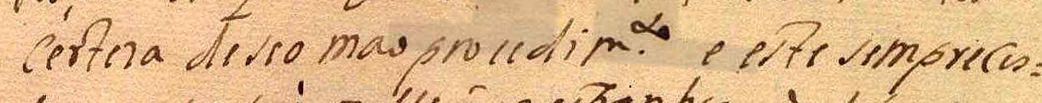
certeza de seo mao procedim.to e este sempre cos
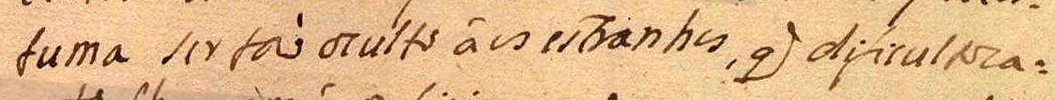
tuma ser taõ oculto áos estranhos, q̄ dificultoza
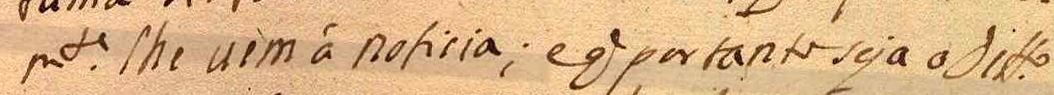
m.te lhe uem á noticia; e q̄ portanto seja o Delt.o
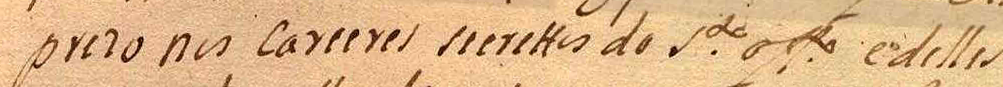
prezo nos carceres secrettos do s.to off.o e delles
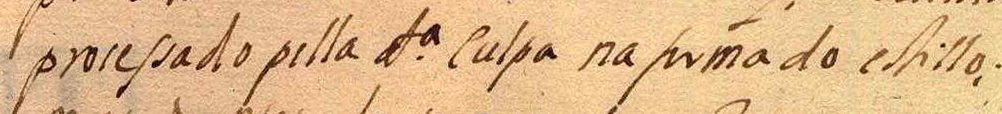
processado pella d̄.a culpa na forma do estillo,
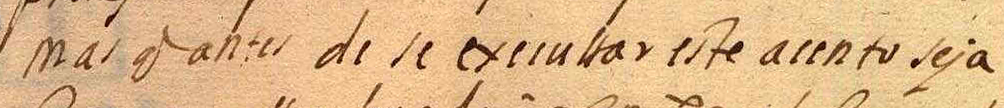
mas q̄ antes de se executtar este acento seja
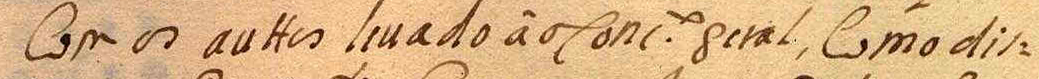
Com os auttos leuado ào Conc.o geral, Como dis
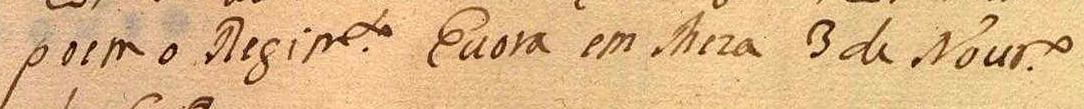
poem o Regim.to Euora em Meza 3 de Nour.o
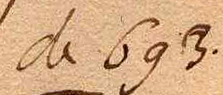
de 693.
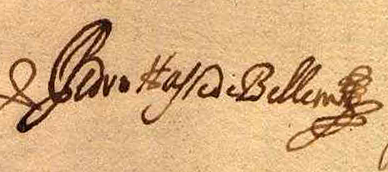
Pedro Hasse de Bellem
